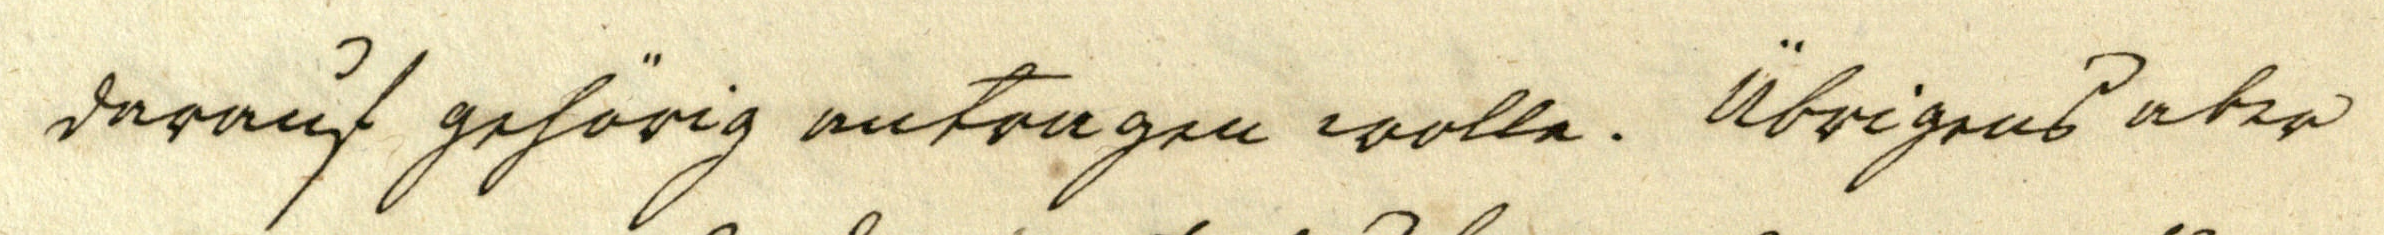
darauf gehörig antragen wolle. Übrigens aber
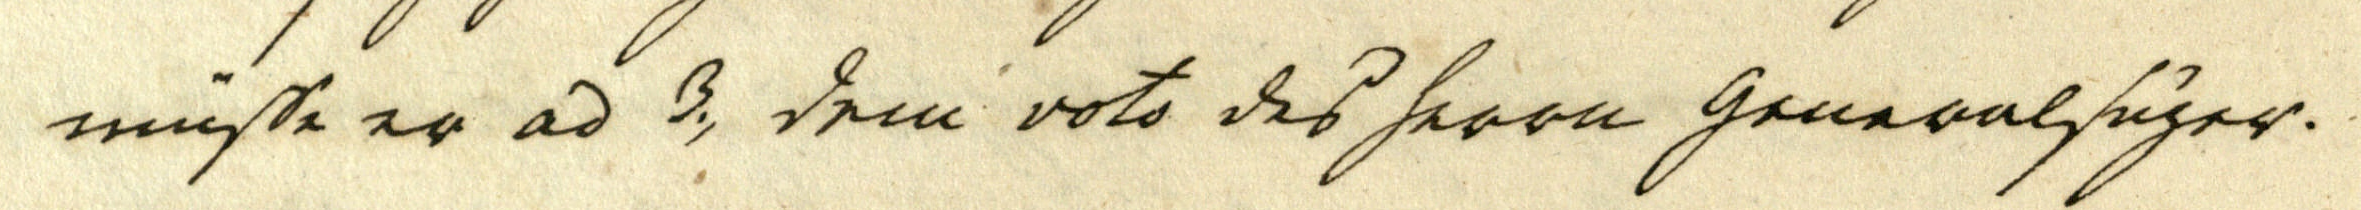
müsse er ad 3., dem voto des herrn Generalsuper¬
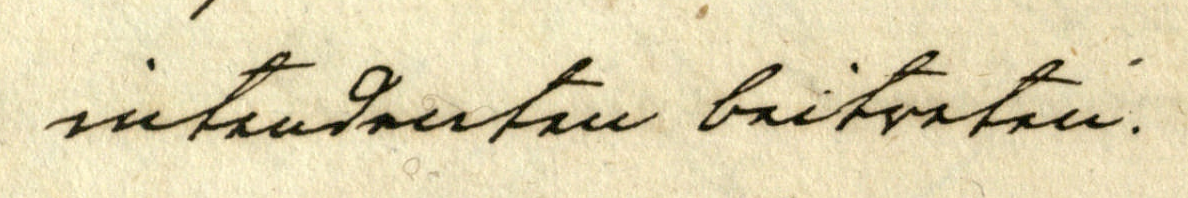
intendenten beitreten.
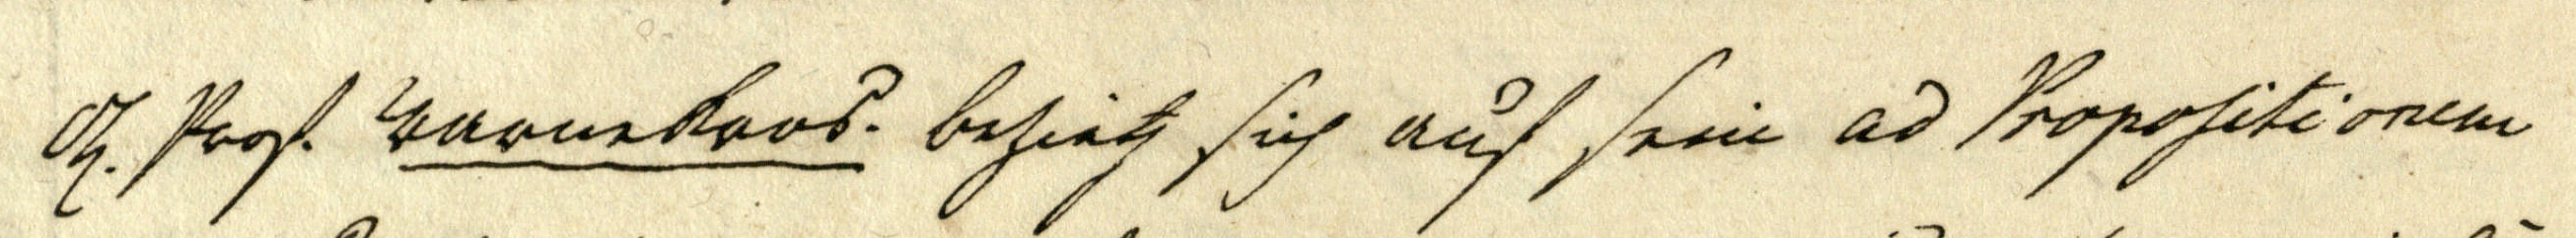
dh. Prof. Warnekros. bezieht sich auf sein ad Propositionem
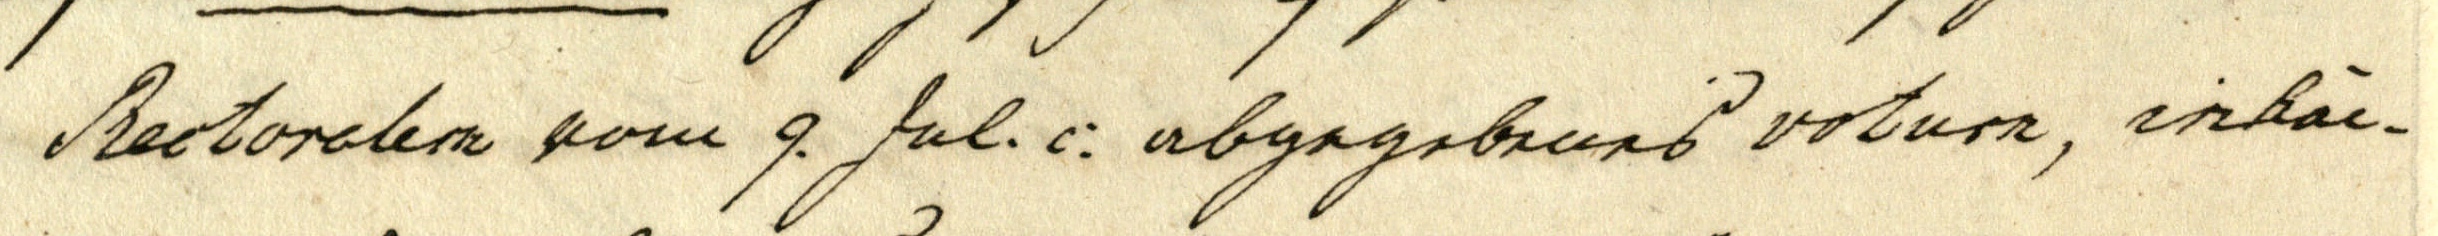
Rectoratem vom 9. Jul. c. abgegebenes votum, inhae¬
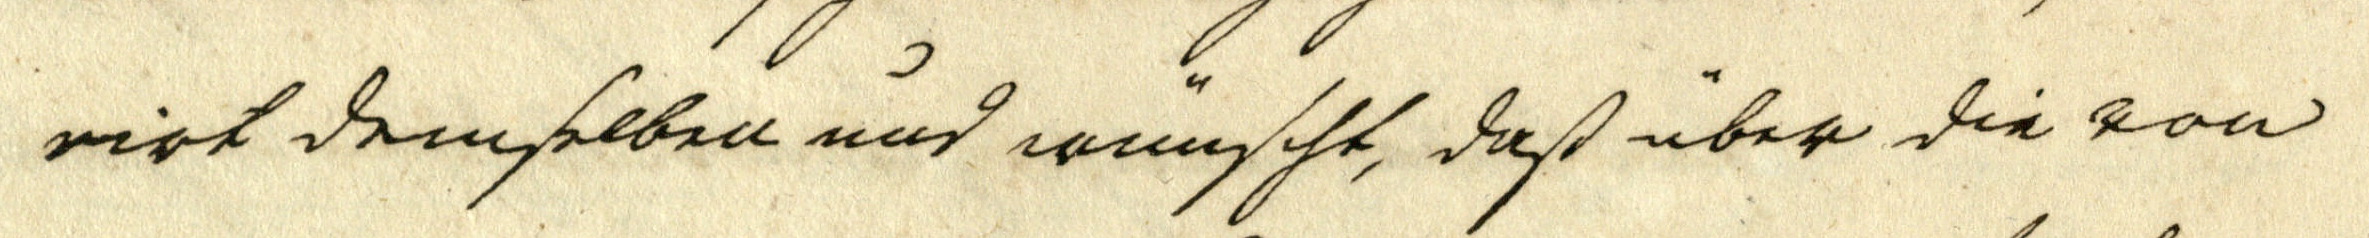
rirt demselben und wünscht, daß über die von
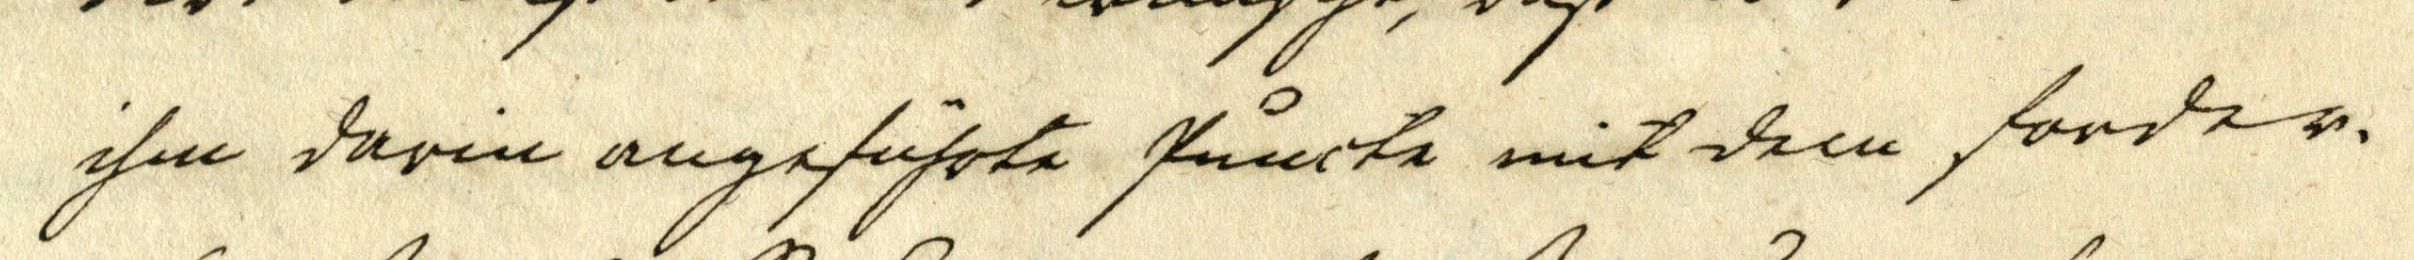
ihm darin angeführte Puncte mit dem forder¬
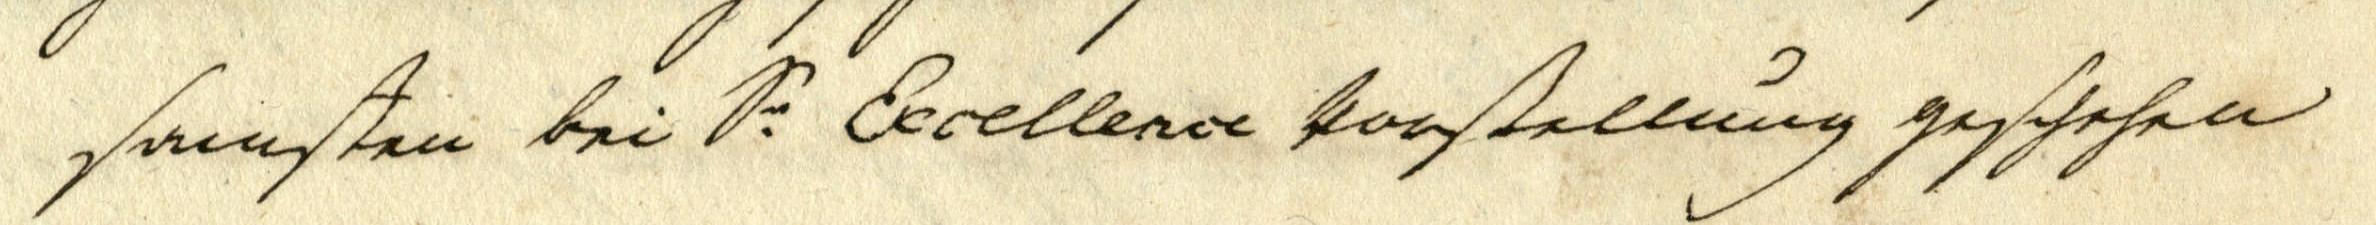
samsten bei Sr. Excellence Vorstellung geschehen
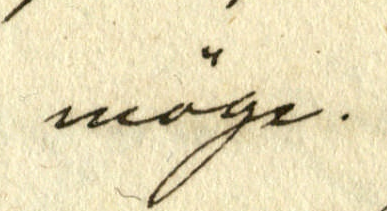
möge.
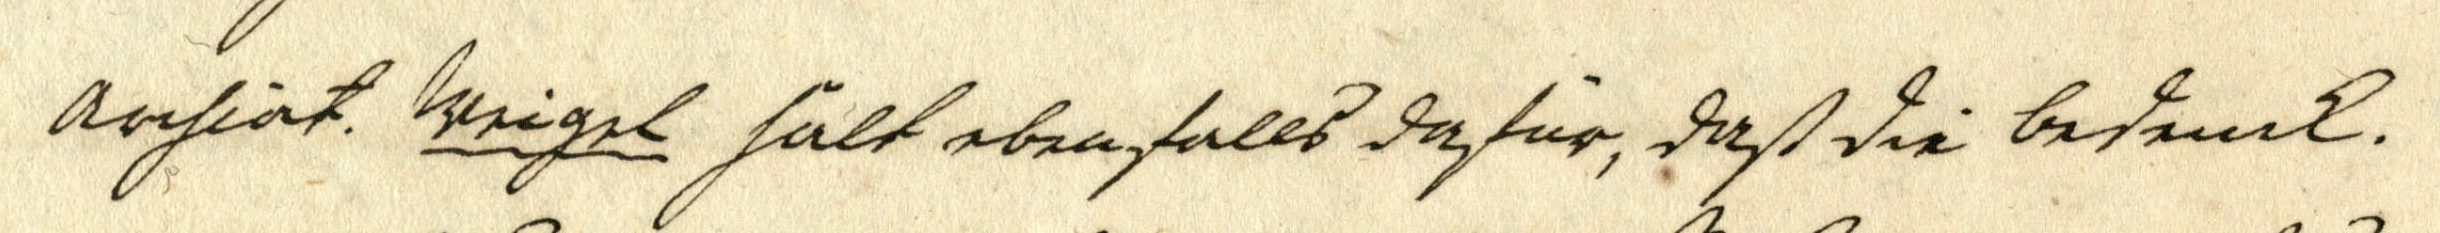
Archiat. Weigel hält ebenfalls dafür, daß die bedenck¬
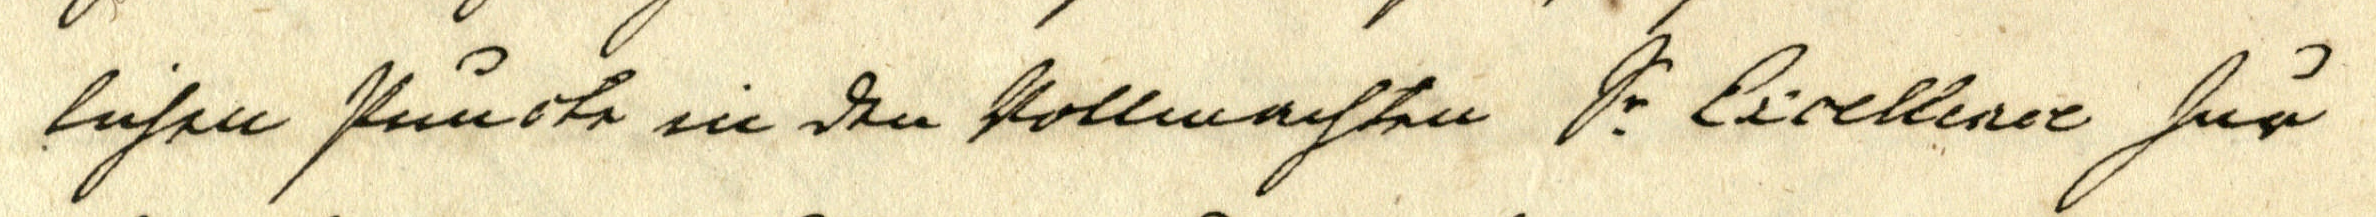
lichen Puncte in den Vollmachten Sr. Excellence zur
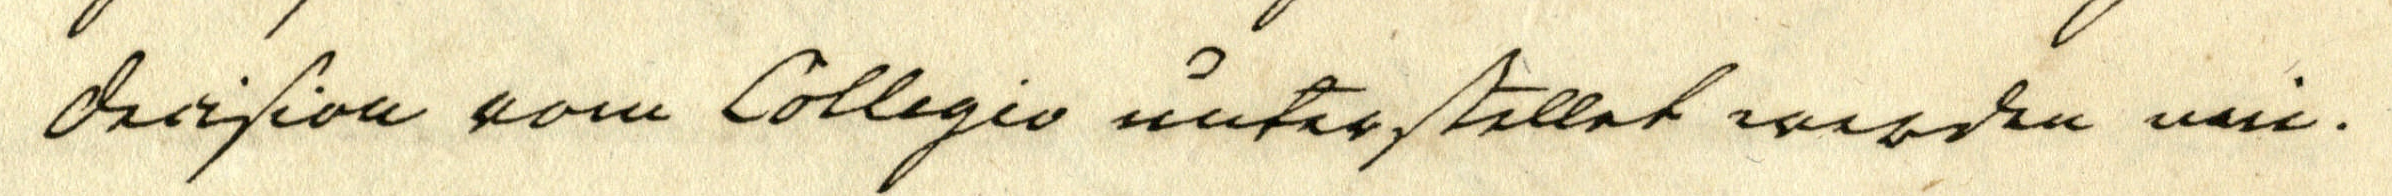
decision vom Collegio unterstellet werden mü¬
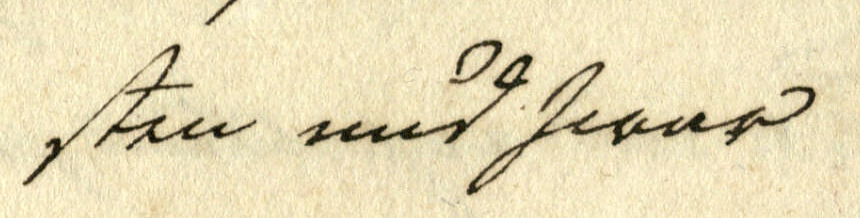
sten und zwar
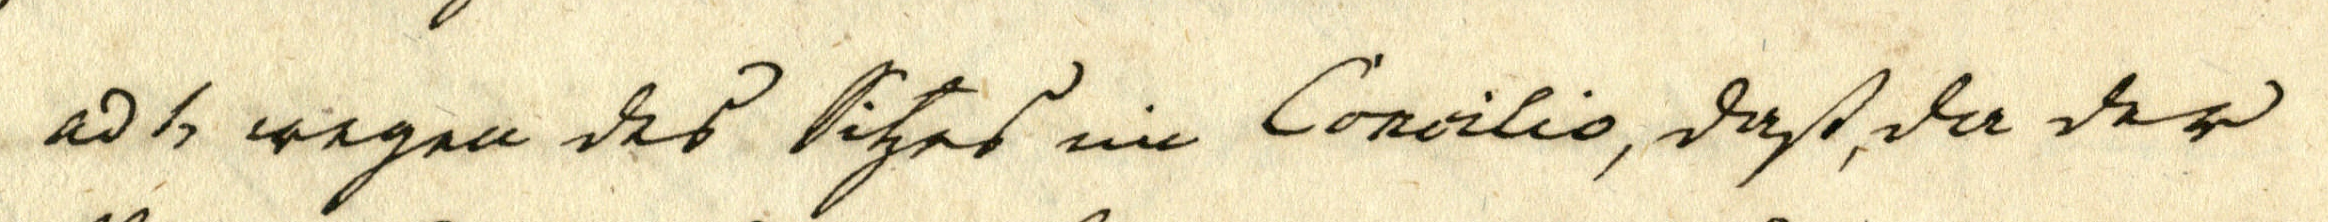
ad 1. wegen des Sitzes im Concilio, daß, da der
